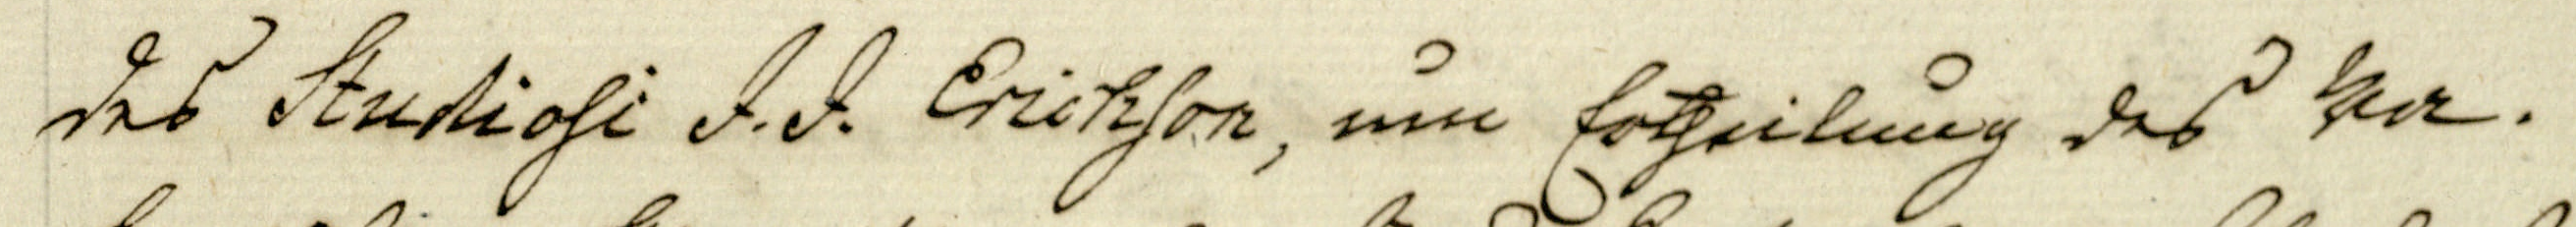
des Studiosi J. J. Erichson, um Ertheilung des Wa¬
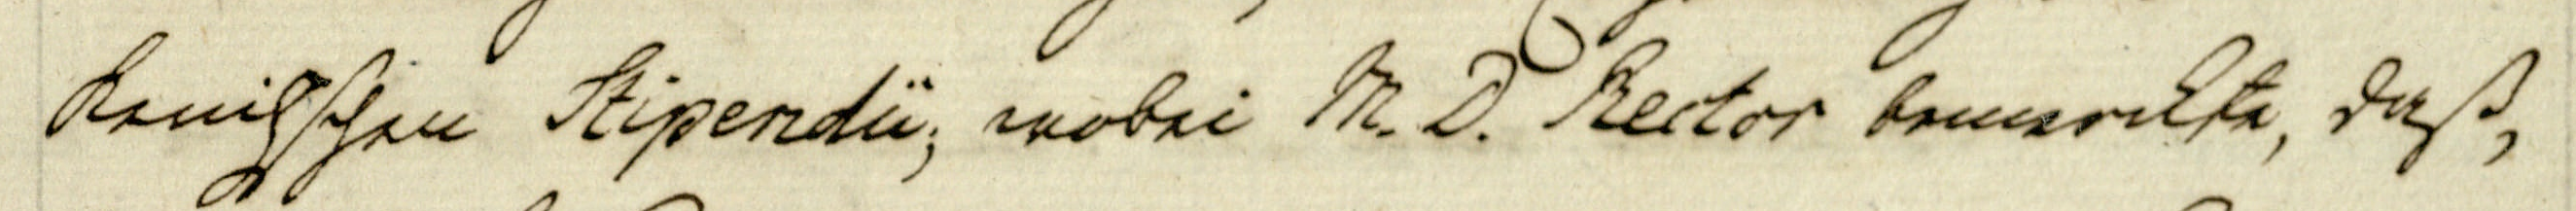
kenizschen Stipendii, wobei M. D. Rector bemerckte, daß
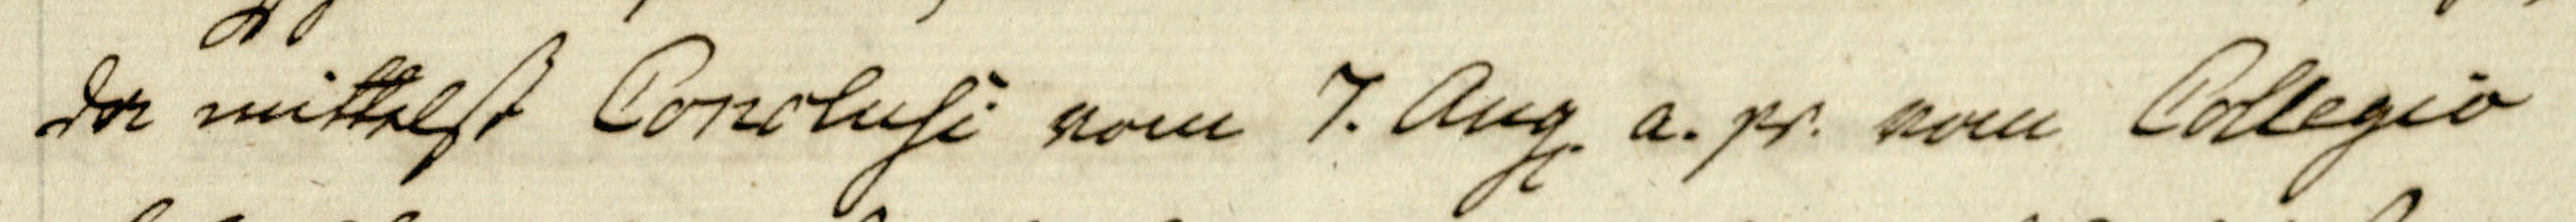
da mittelst Conclusi vom 7. Aug. a. p. vom Collegio
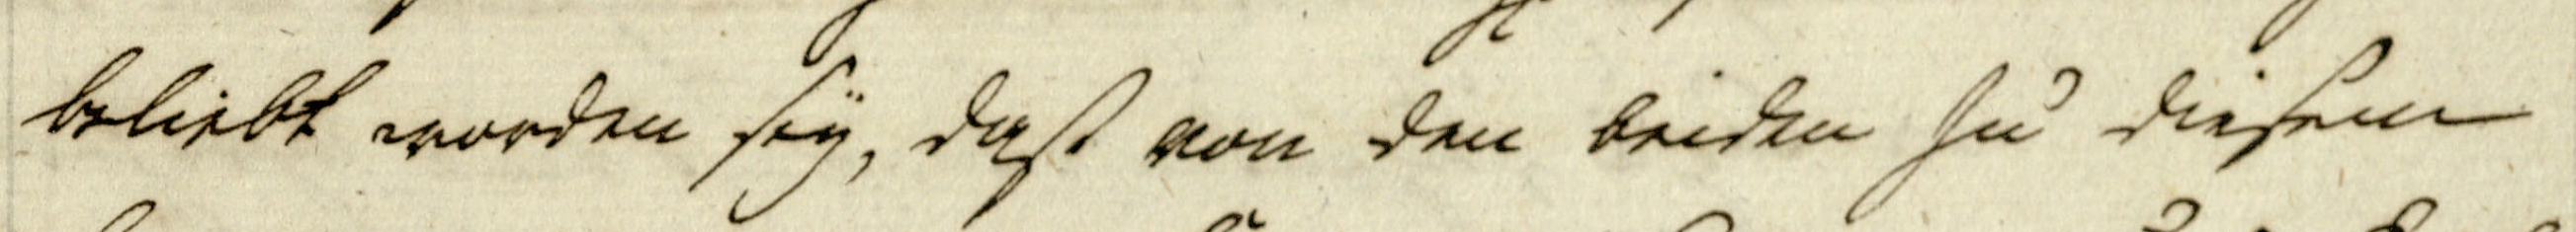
beliebt worden seÿ, daß von den beiden zu diesem
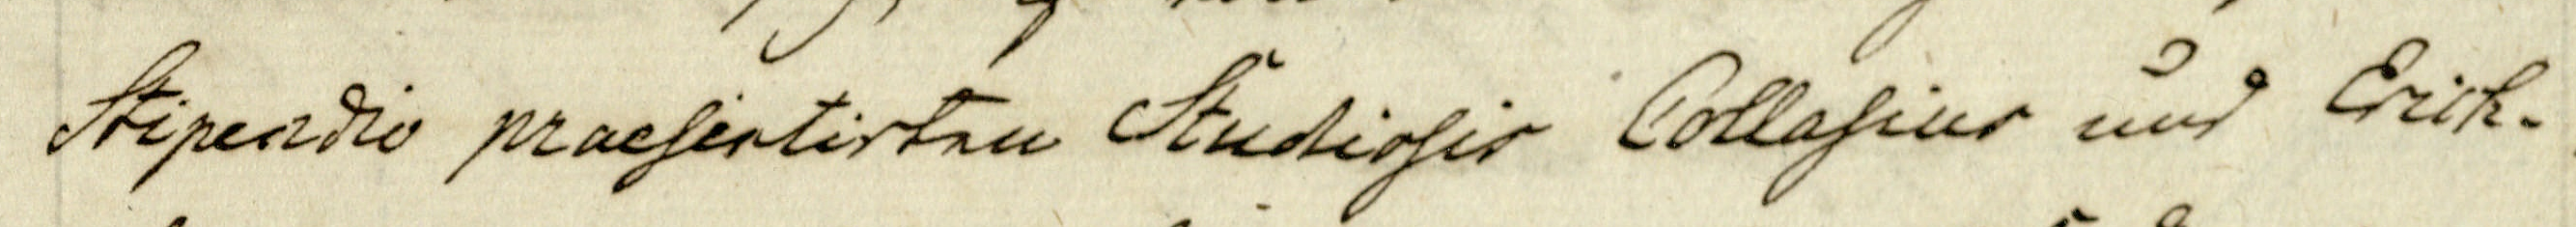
Stipendio praesentirten Studiosis Collasius und Erich¬
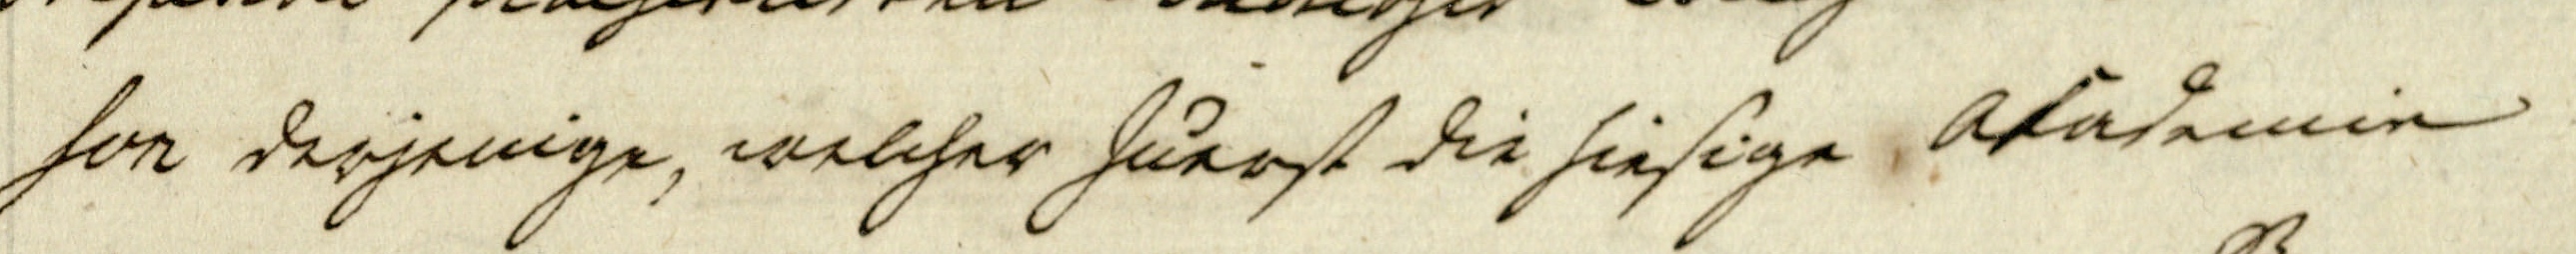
son derjenige, welcher zuerst die hiesige Akademie
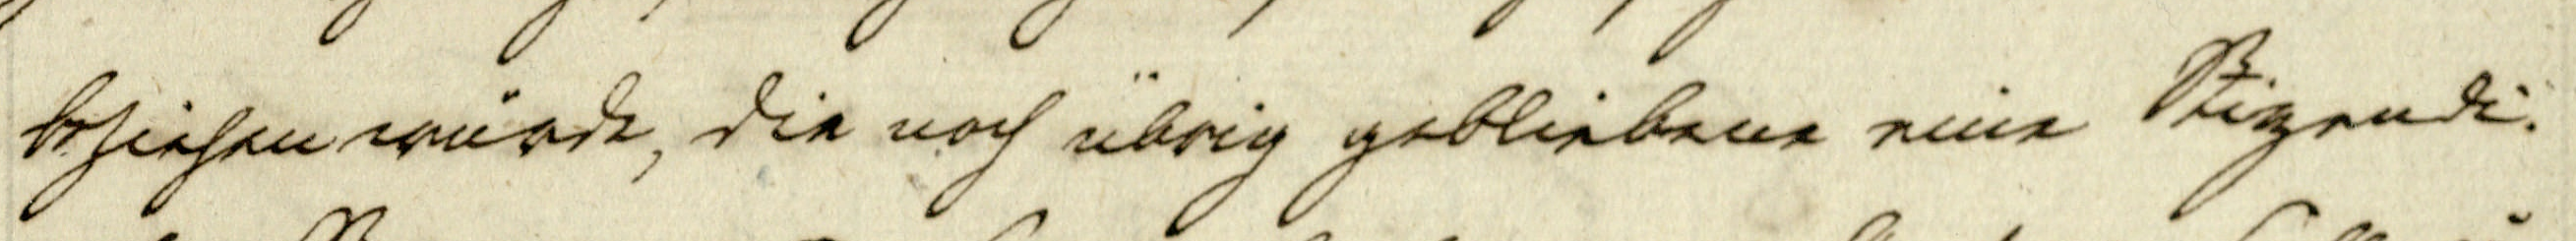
beziehen würde, die noch übrig gebliebene eine Stipendi¬
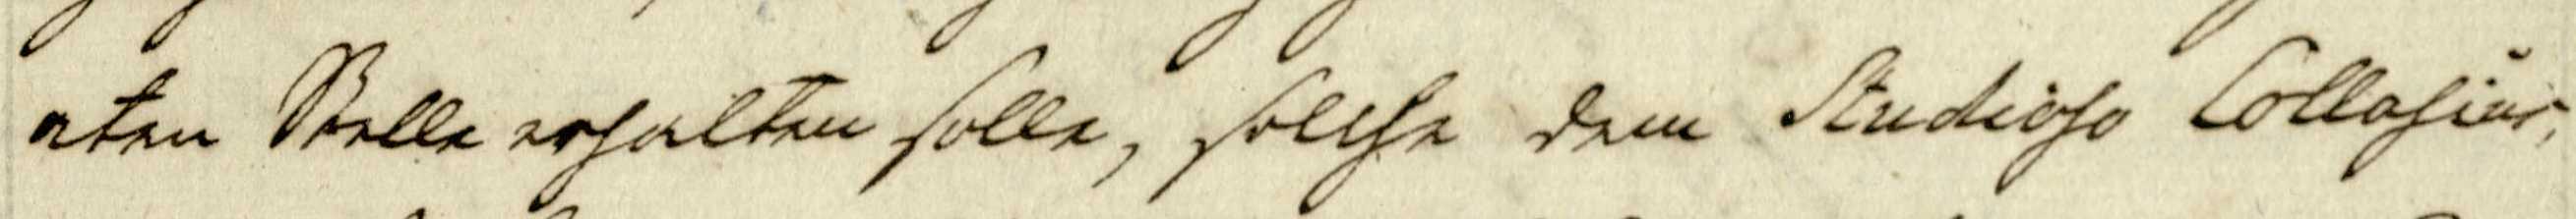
aten Stelle erhalten solle, solche dem Studioso Collasius,
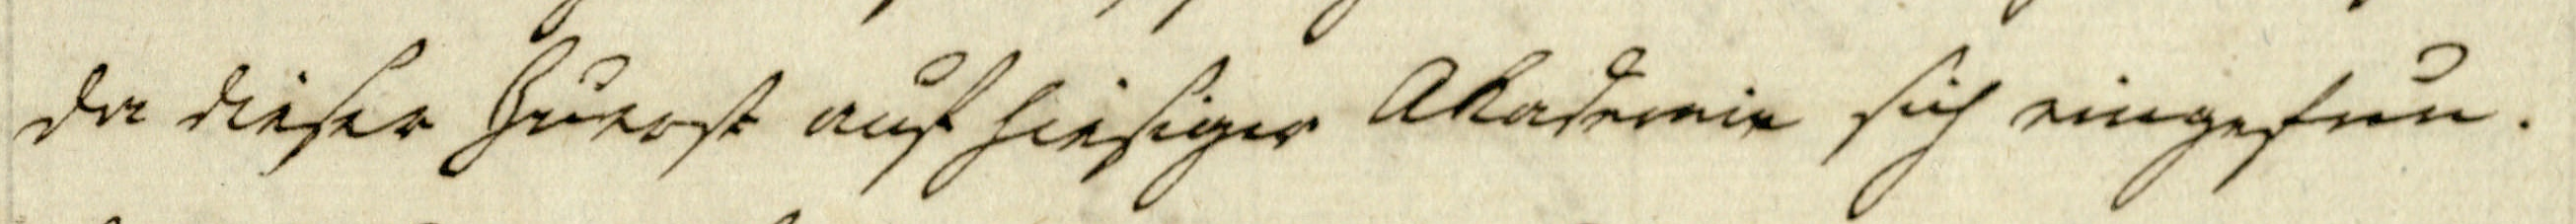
da dieser zuerst auf hiesiger Akademie sich eingefun¬
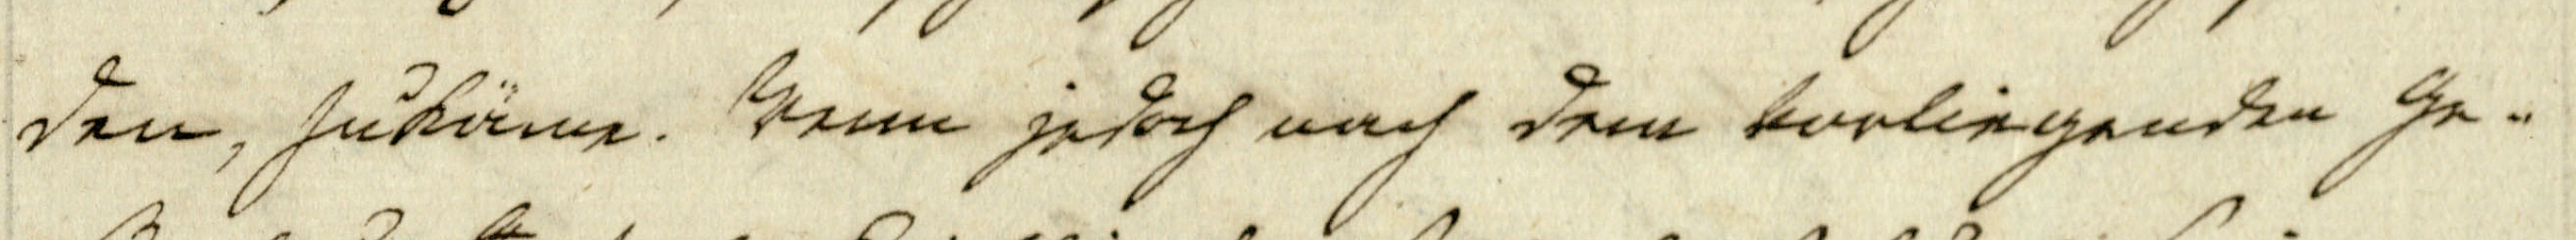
den, zukäme. Wenn jedoch nach dem vorliegenden Ge¬
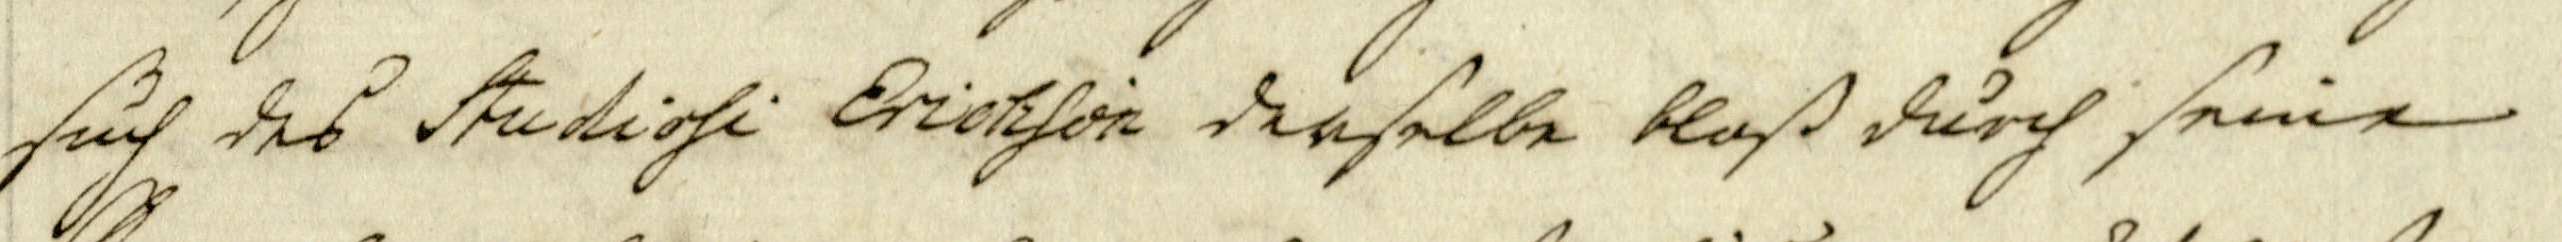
such des Studiosi Erichson derselbe bloß durch seine
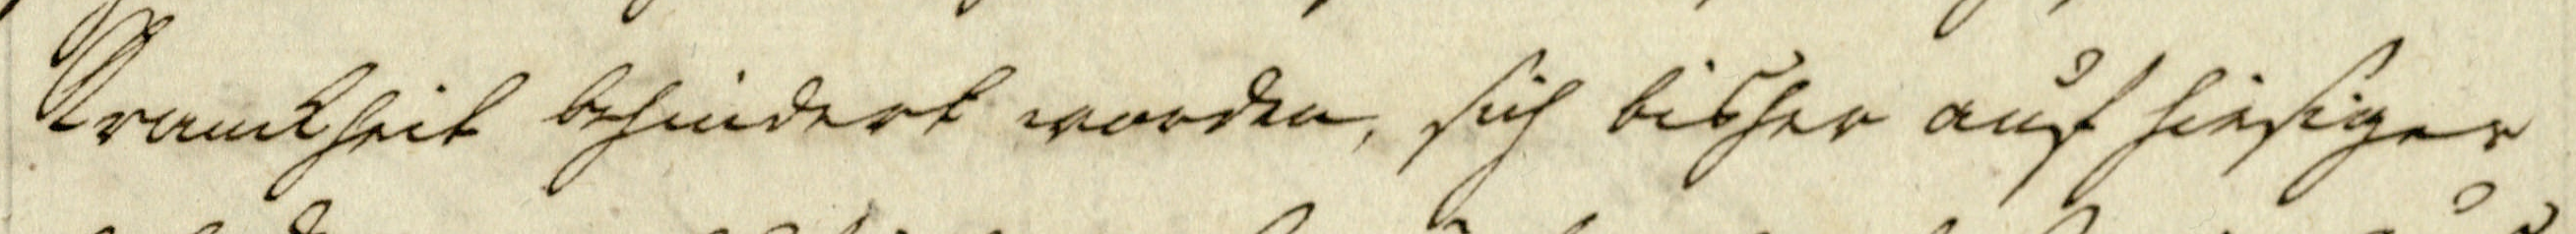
Kranckheit behindert worden, sich bisher auf hiesiger
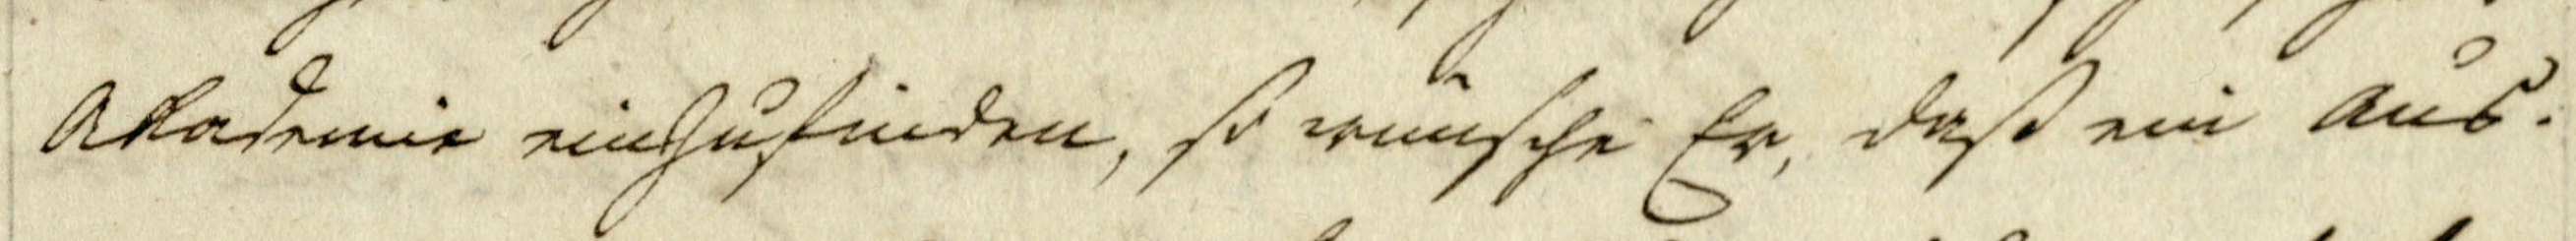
Akademie einzufinden, so wünsche Er, daß ein Aus¬
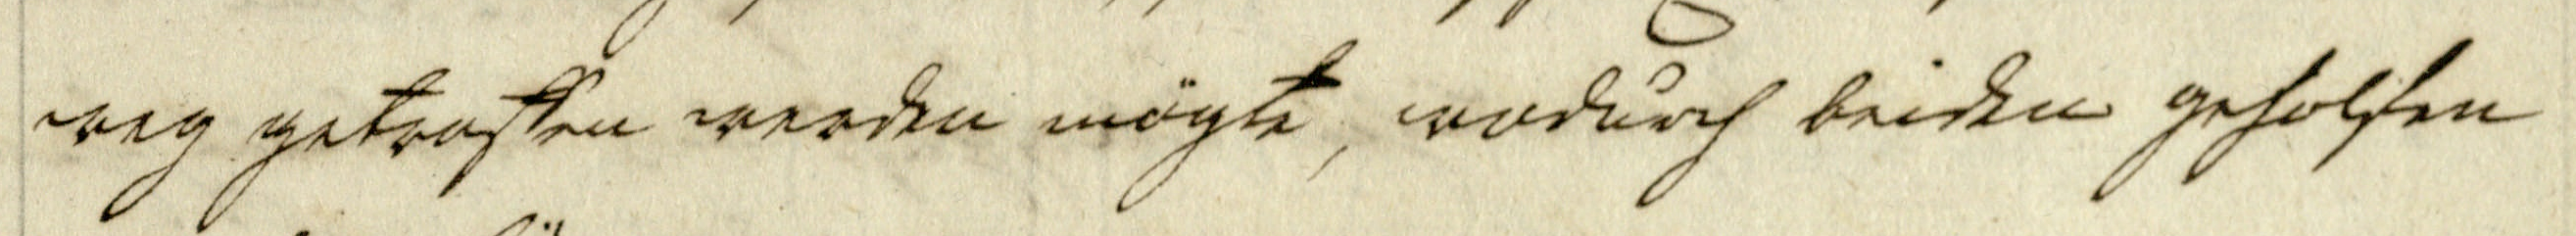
weg getroffen werden mögte, wodurch beiden geholfen
